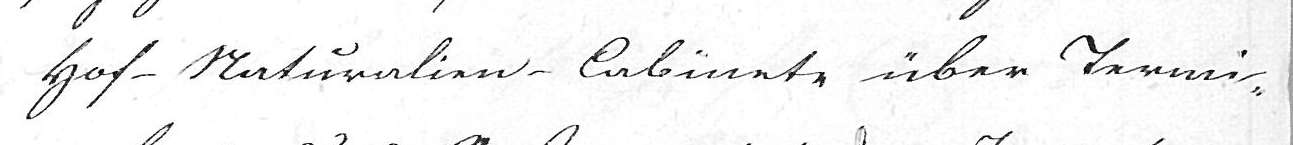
Hof-Naturalien-Cabinete über Termi-
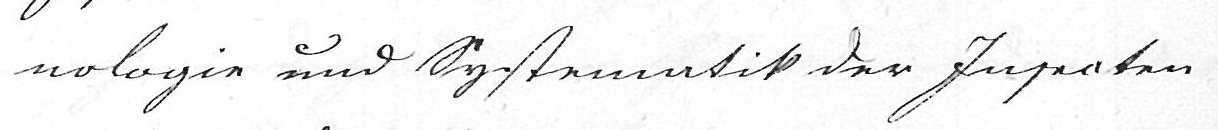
nologie und Systematik der Insecten
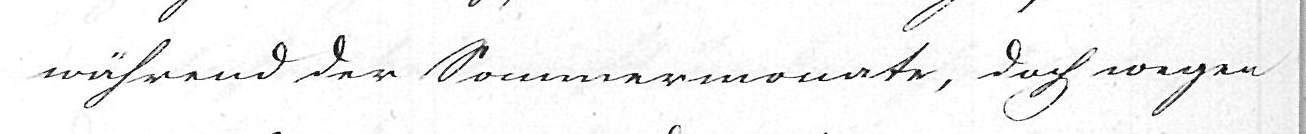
während der Sommermonate, doch wegen
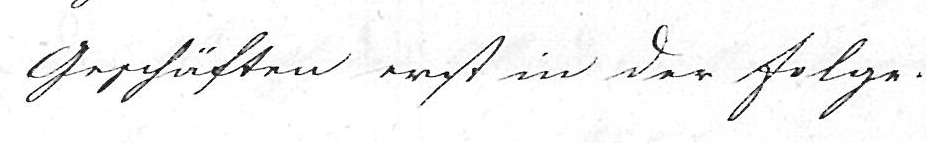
Geschäften erst in der Folge.
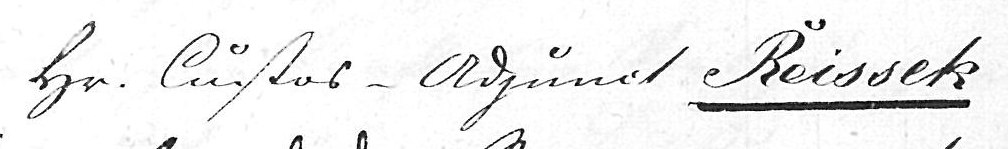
Hr. Custos-Adjunct Reissek
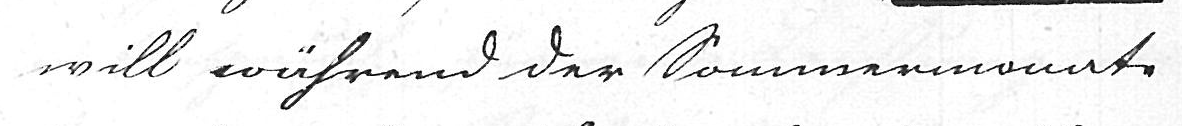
will während der Sommermonate
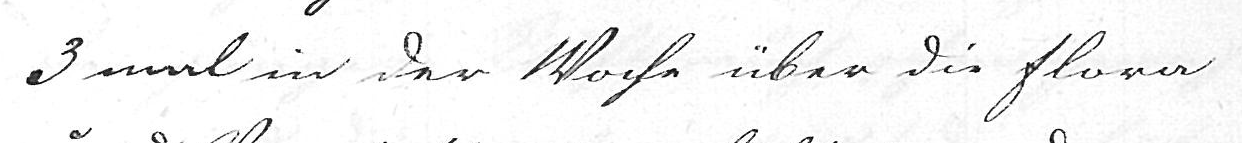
3 mal in der Woche über die Flora
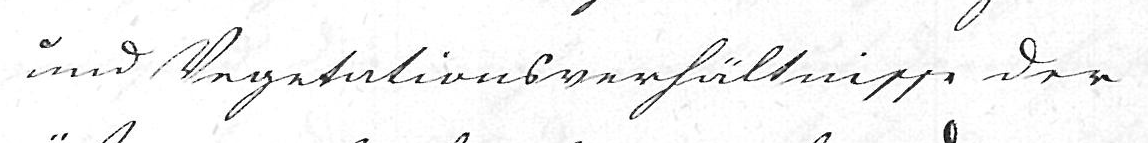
und Vegetationsverhältnisse der
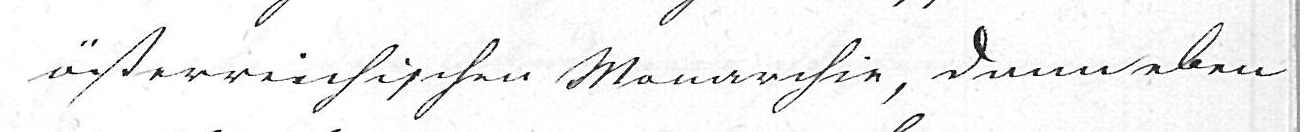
österreichischen Monarchie, dann eben
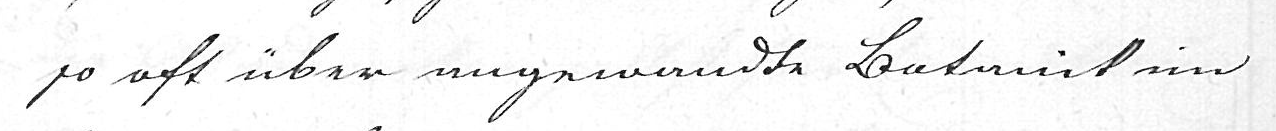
so oft über angewandte Botanik im
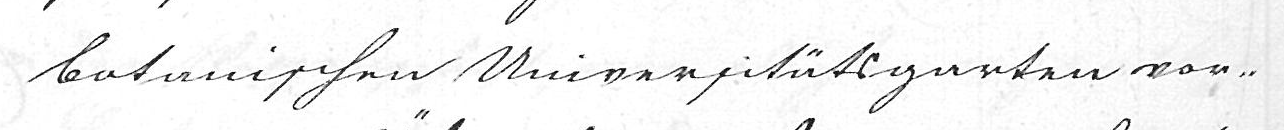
botanischen Universitätsgarten vor-
